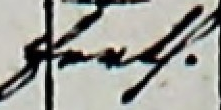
Ferth.
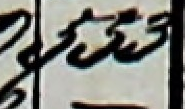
553
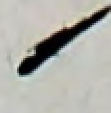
1
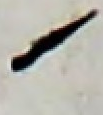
1
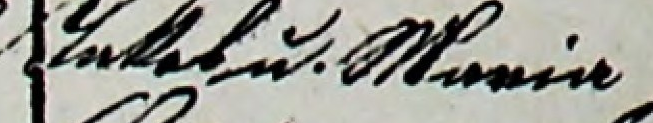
Jakob u. Maria
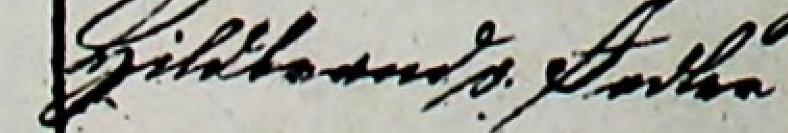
Hildbrand v. Jodler
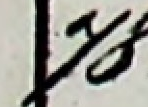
78
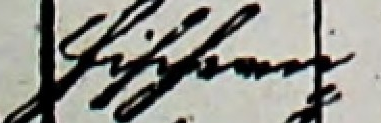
Hisch???
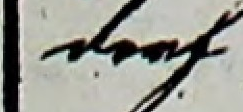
dorf
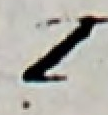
I
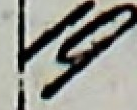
19
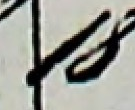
18
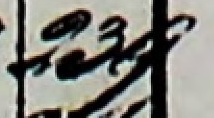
239
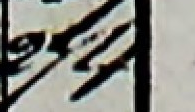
274
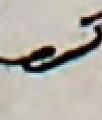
3
